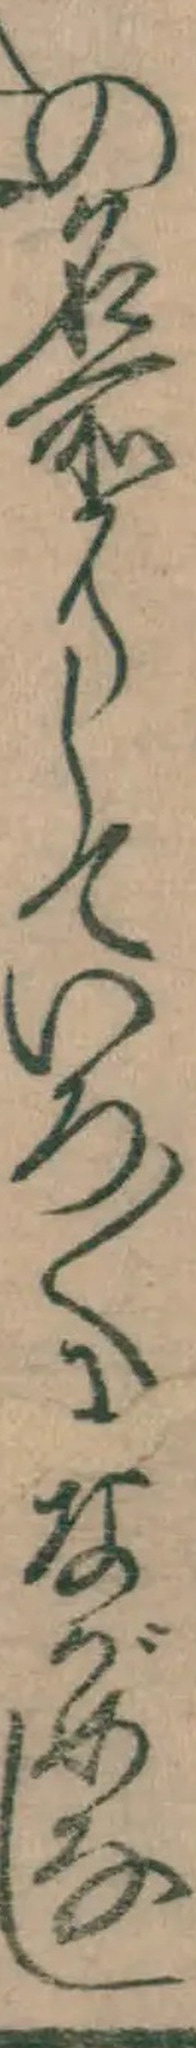の名所にしていろ〳〵にながめなし
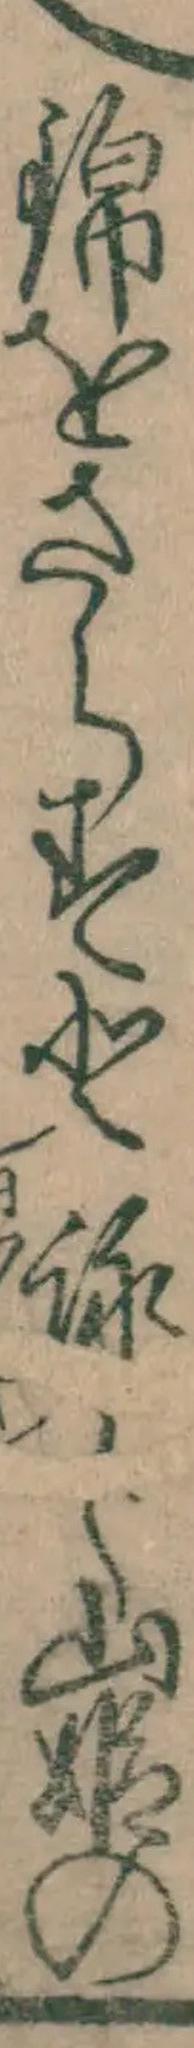錦をさらすと詠し山姫の
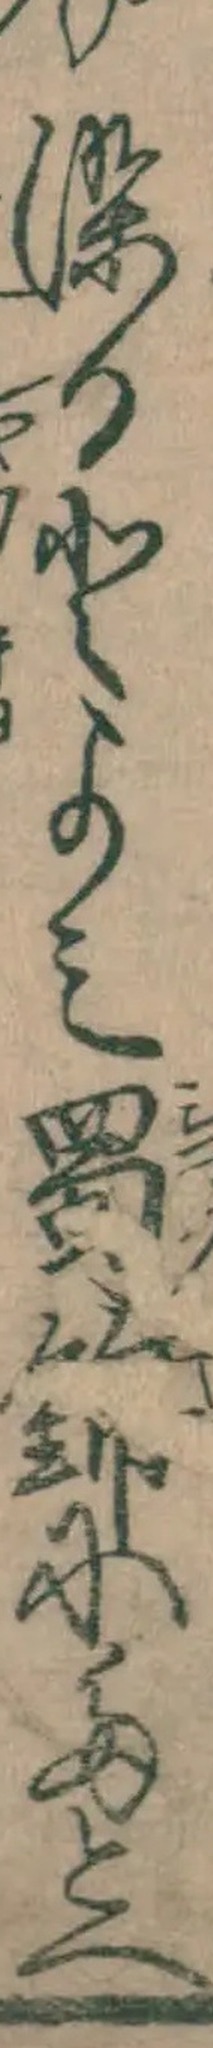染るとよみ蜀錦にたとへ
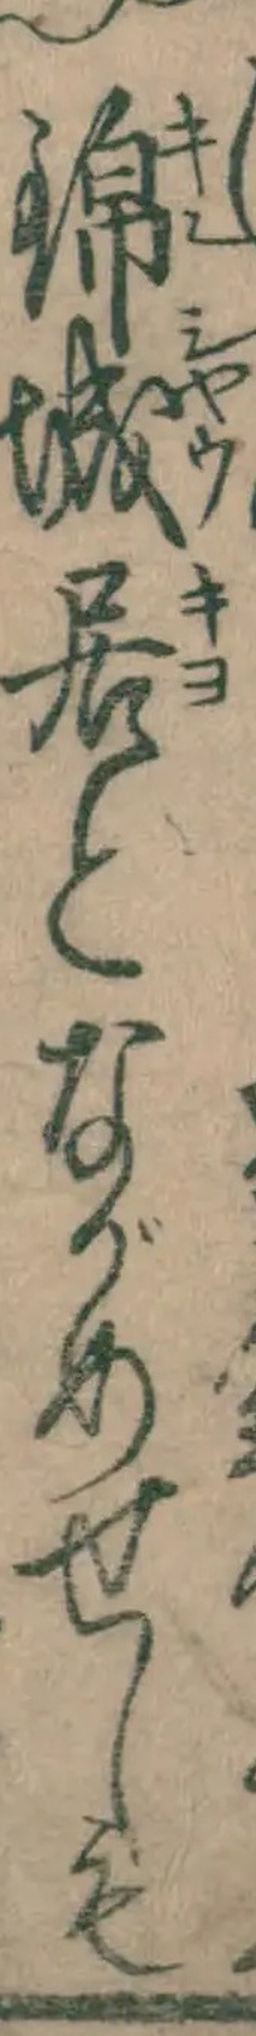錦城居とながめせしも
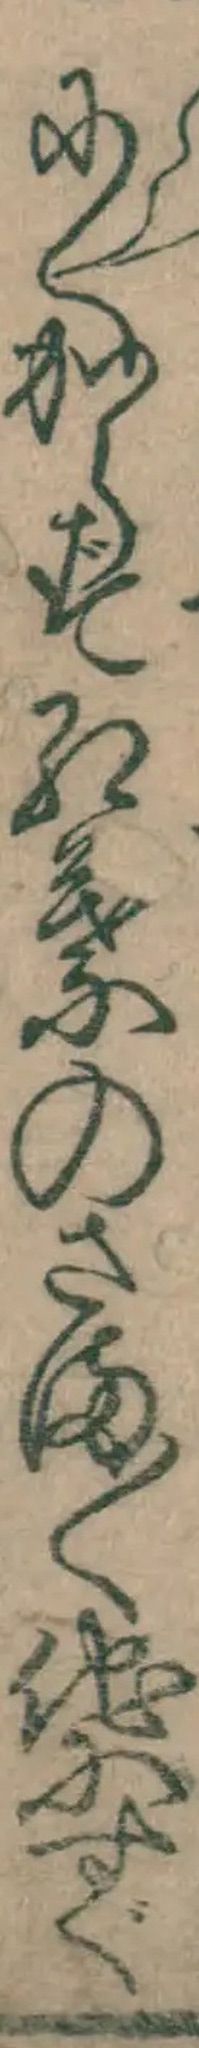高倉院にくからず紅葉のさま〳〵他にすぐ
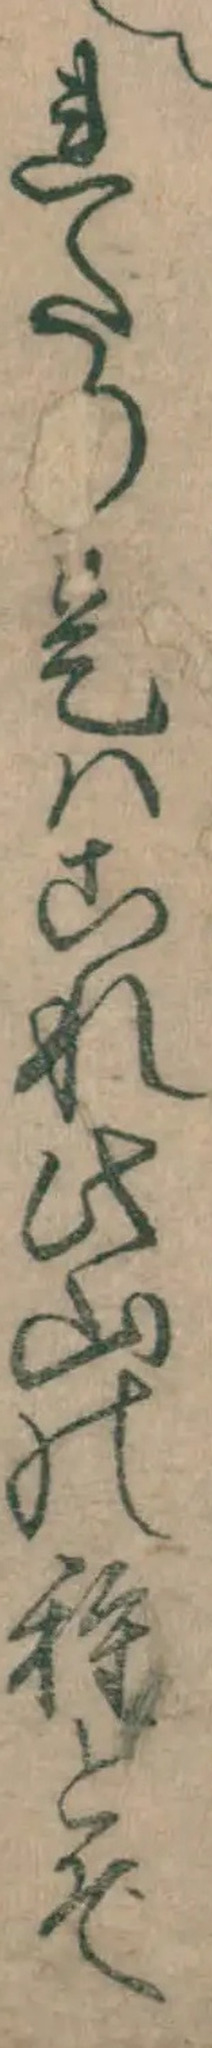御哥れたり是はこれ此山の種とぞ
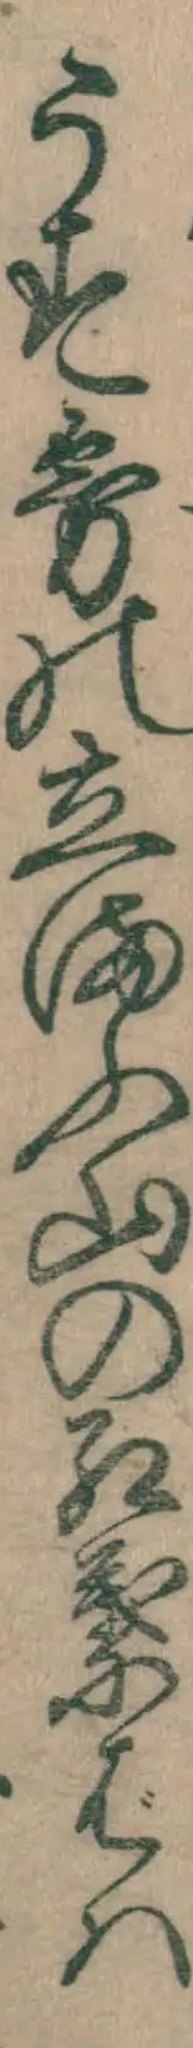うす霧の立まふ山の紅葉ばは
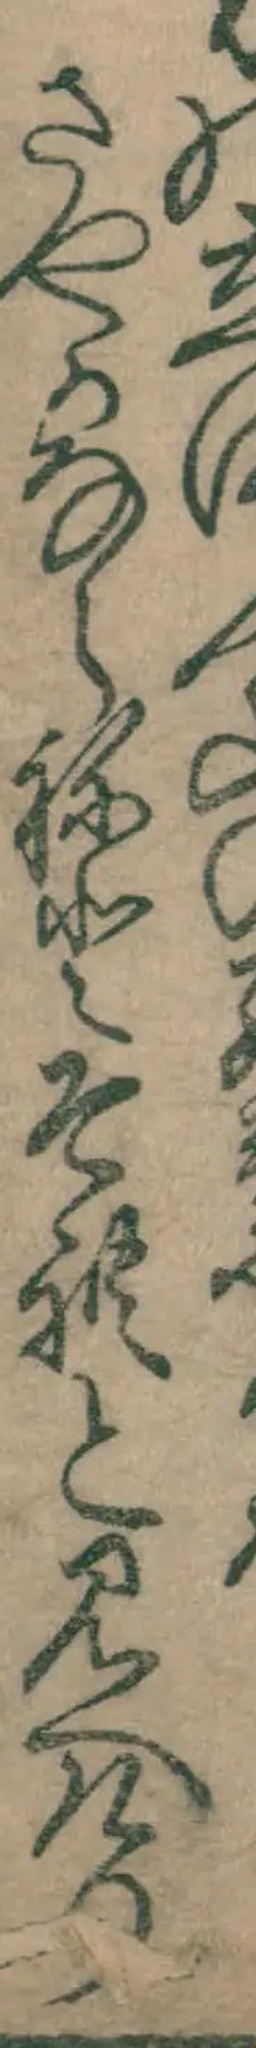さやかならねとそれと見へけり

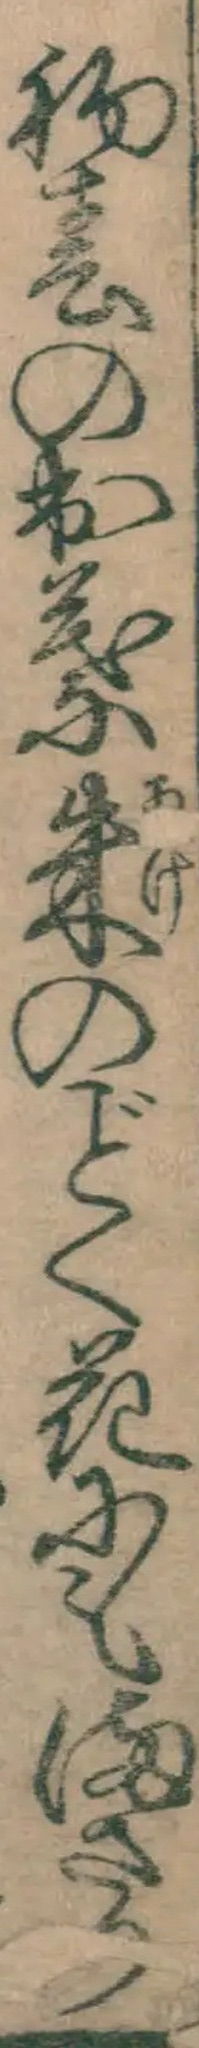八染初春出葉朱のごとく花にもまさり
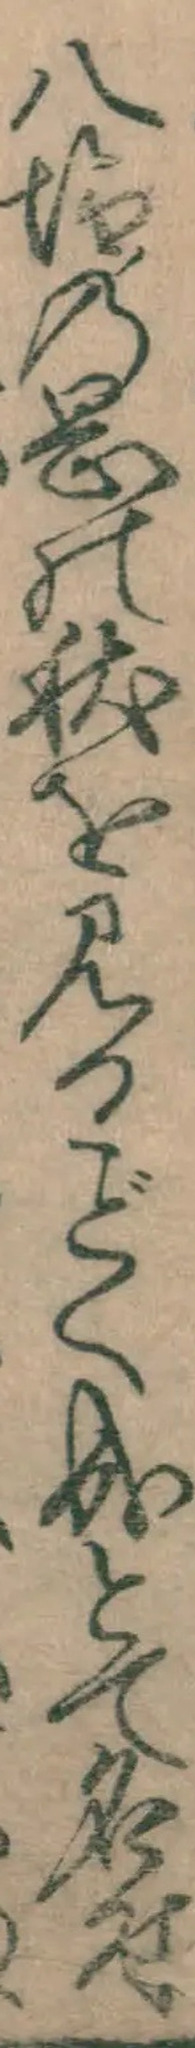八塩の岡の秋を見るごとく成とて名付
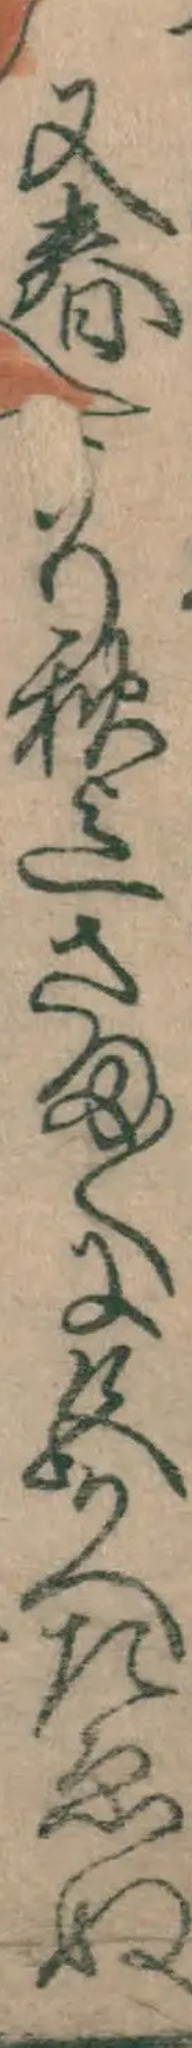又春より秋迄さま〳〵に色かへたゑぬ
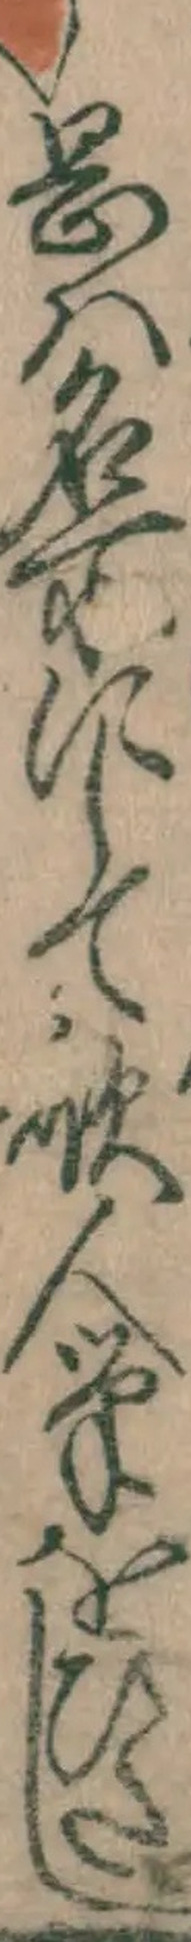岡は名所にして歌人筆をひたし
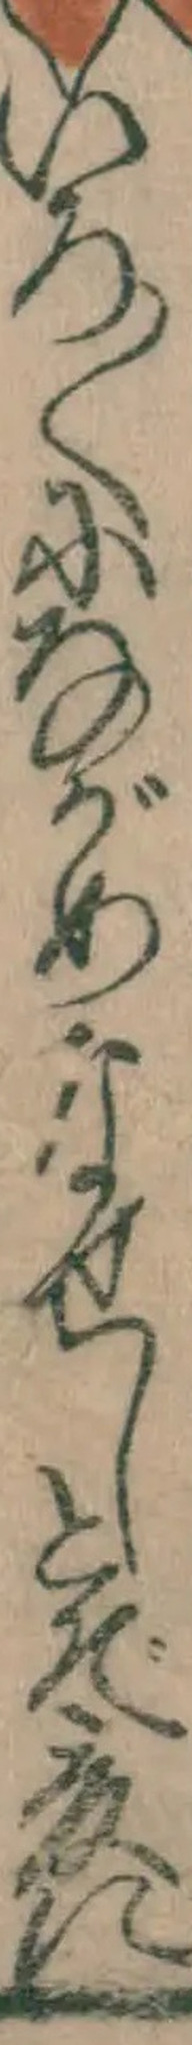いろ〳〵にながめなせしとぞ夏に
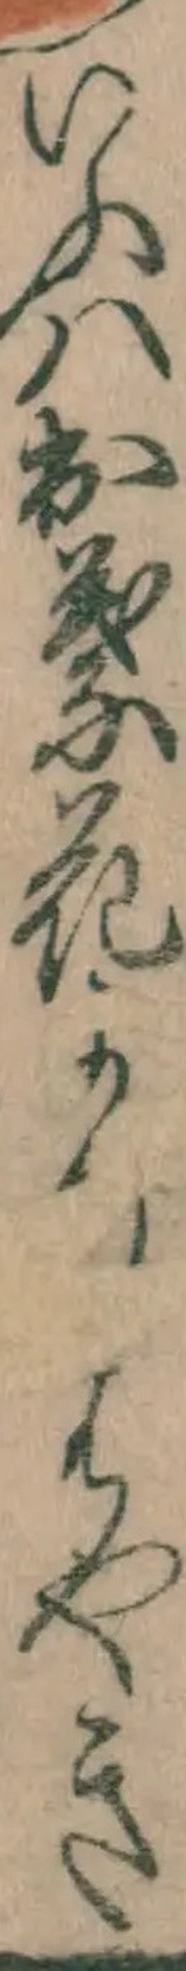いふは出葉花よりはやき
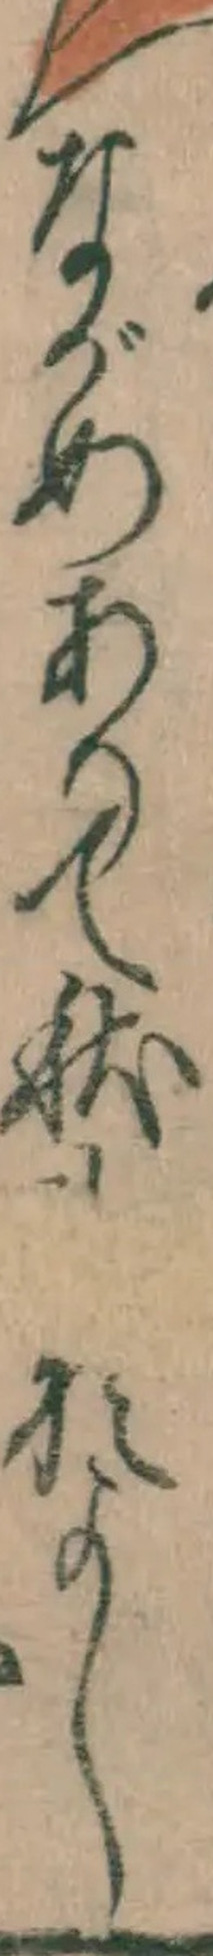ながめありて秋も猶よし
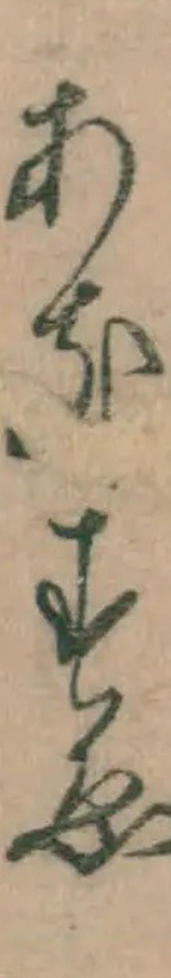あきすゑ
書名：紅葉集
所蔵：国立国会図書館 National Diet Library, JAPAN
